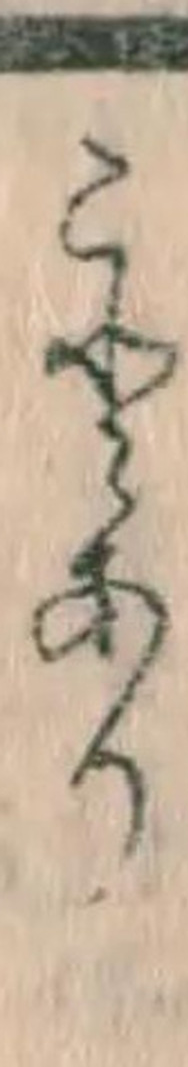ことあり
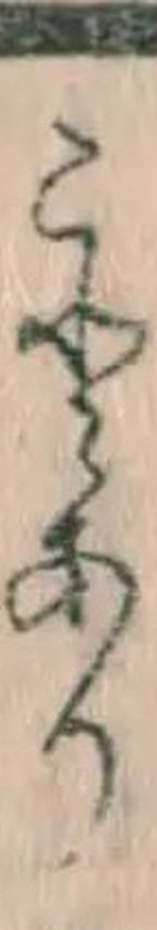ことあり
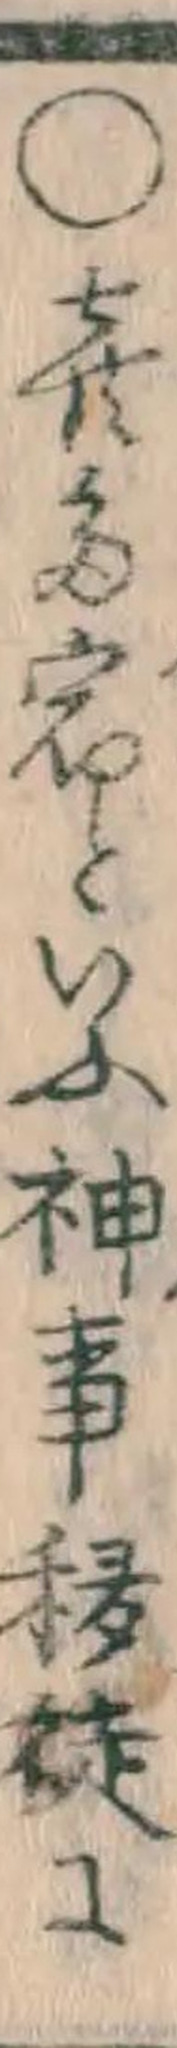○喜多宿といふ神事移徒に
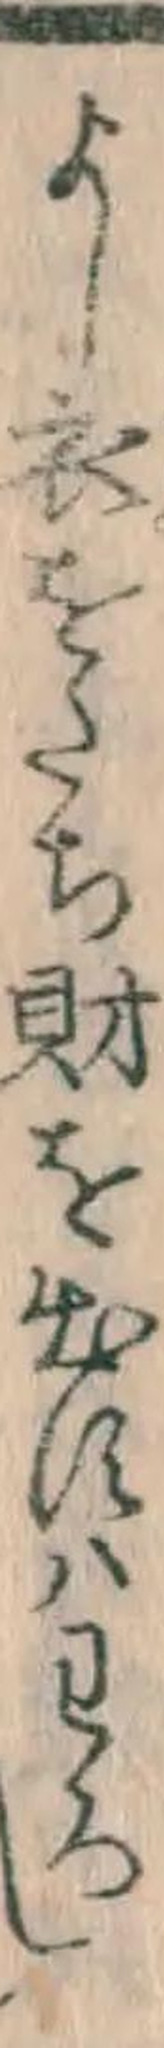よし衣をたち財を出すはわろし
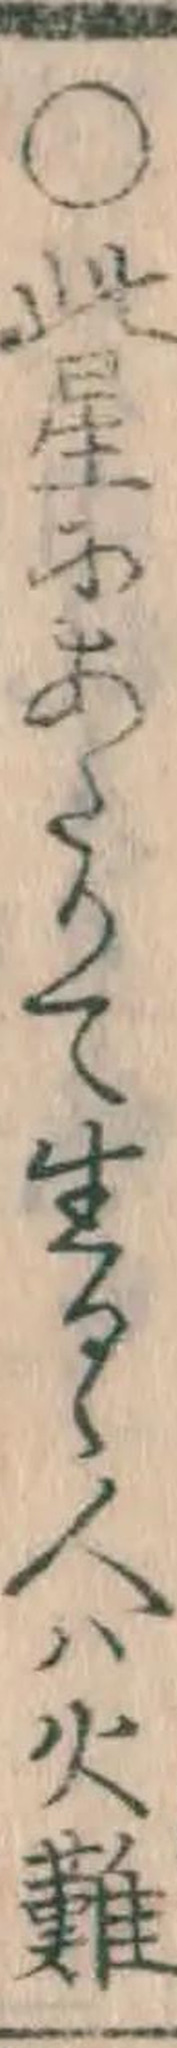○此星にあたりて生るゝ人は火難
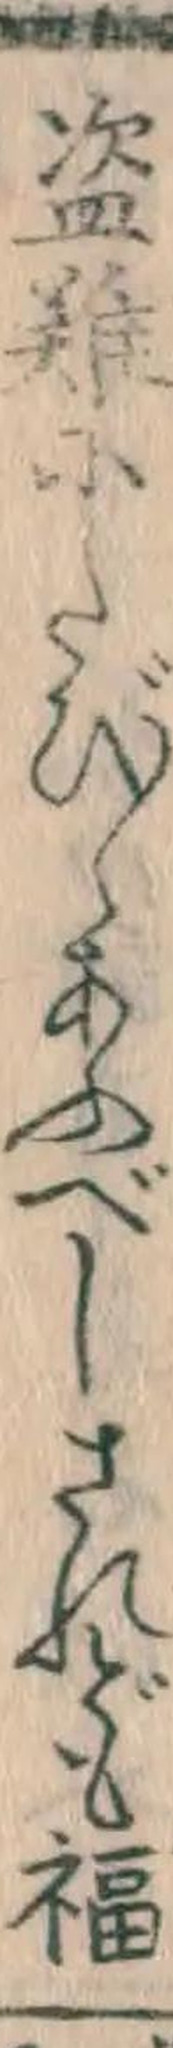盗難にたび〴〵あふべしされども福
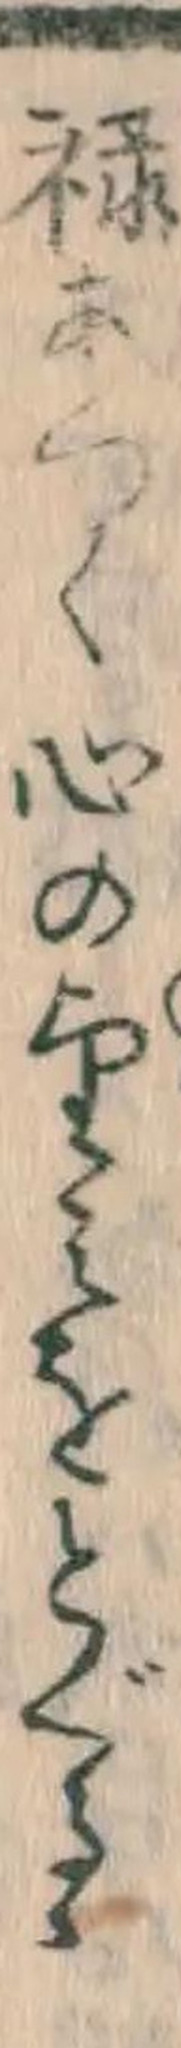禄あつく心の望みをとぐるゝ
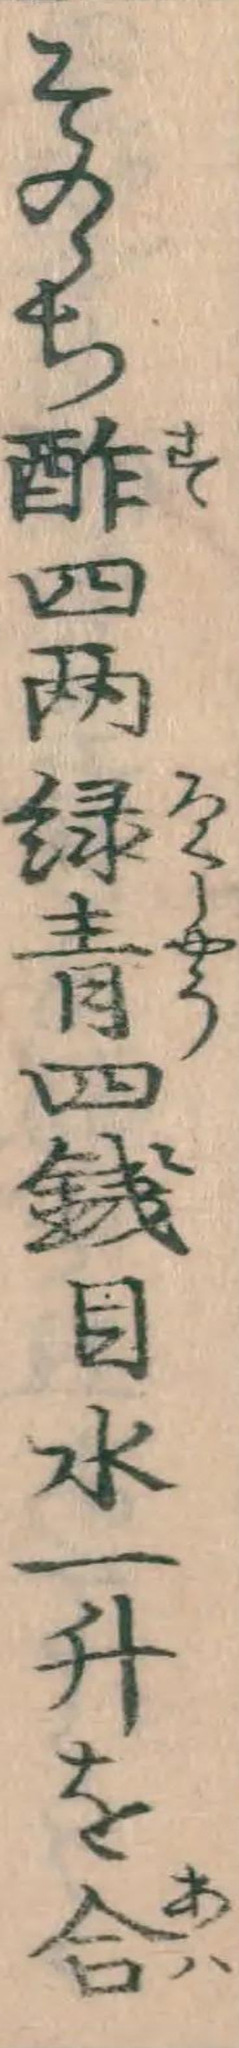そのゝち酢四両緑青四銭目水一升を合
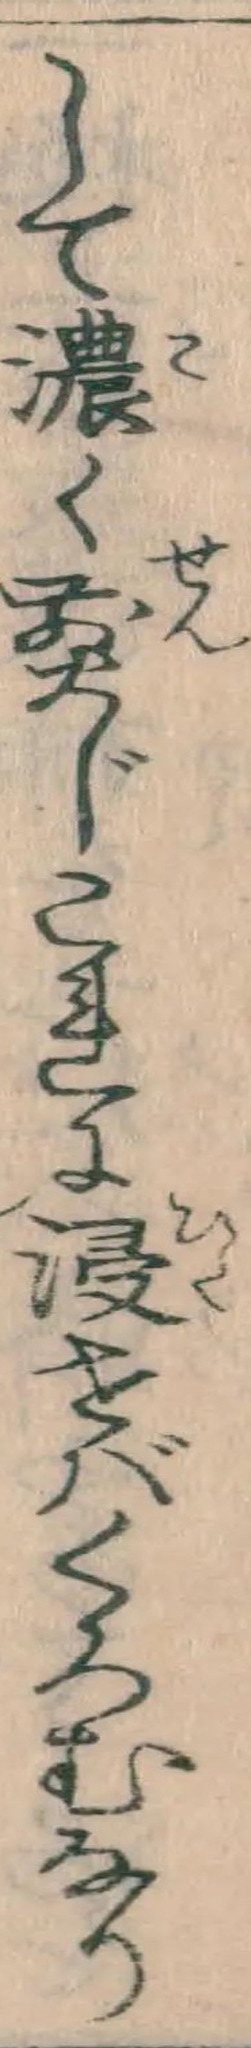して濃く煎じこれに浸せばくろむなり
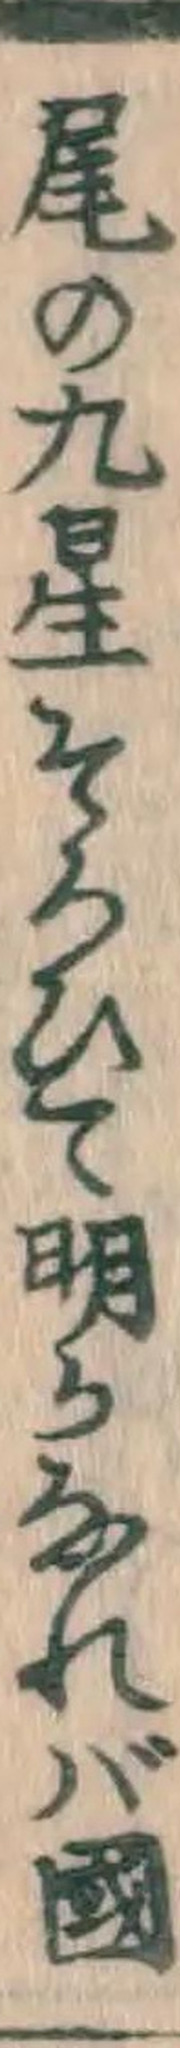尾の九星そろひて明かなれば国
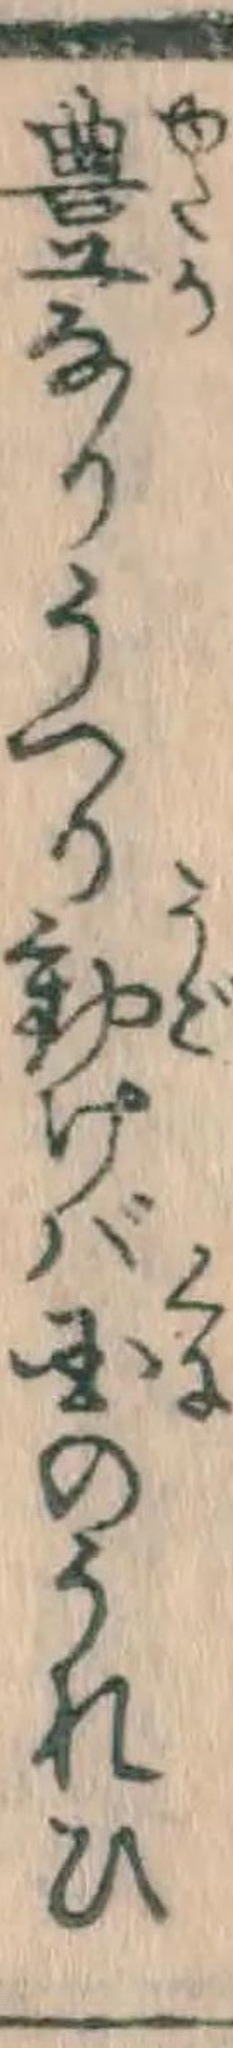豊なりうつり動けば国のうれひ
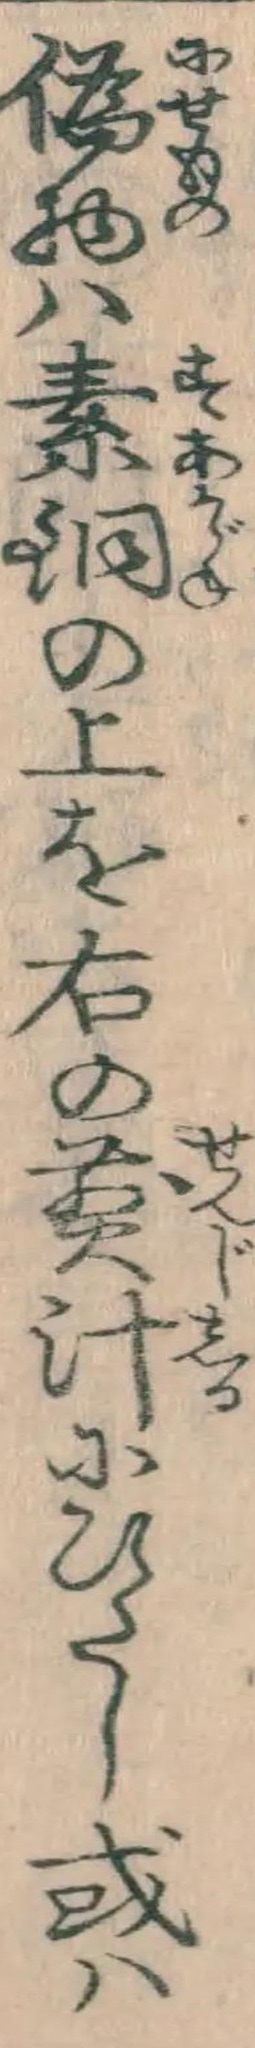偽物は素銅の上を右の煎汁にひたし或は
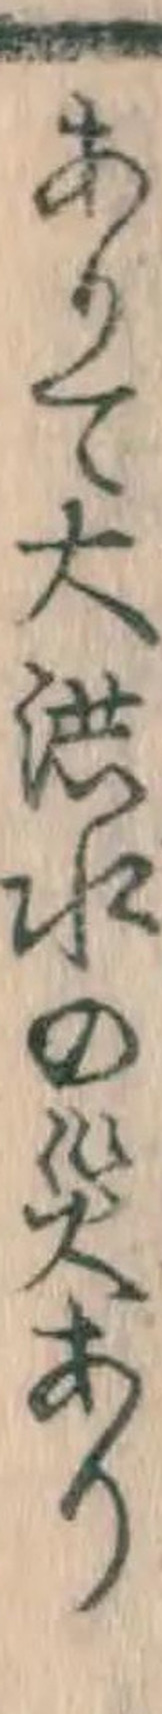ありて大洪水の災あり
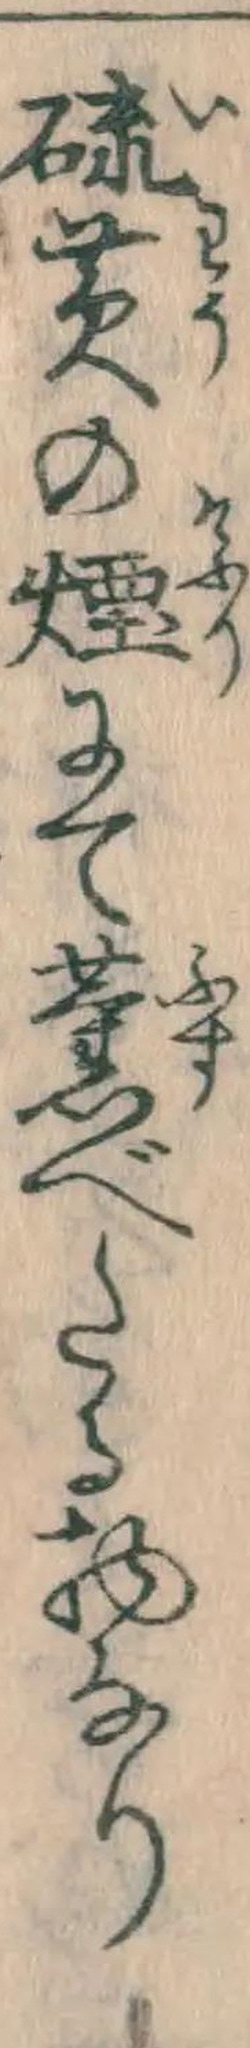硫黄の煙にて薰べたる物なり
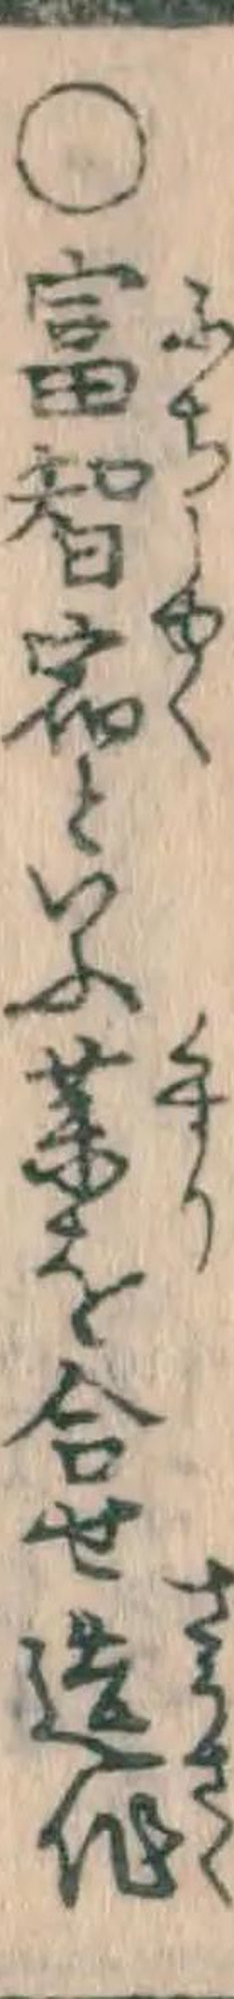○富智宿といふ薬を合せ造作
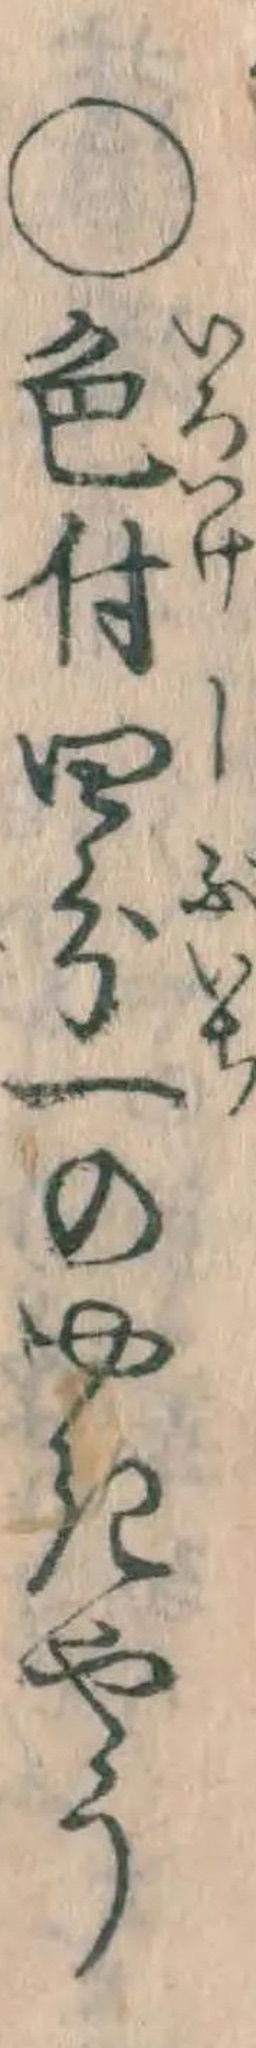○色付四分一のやきやう
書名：広益秘事大全 3巻. [2]
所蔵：国立国会図書館 National Diet Library, JAPAN
